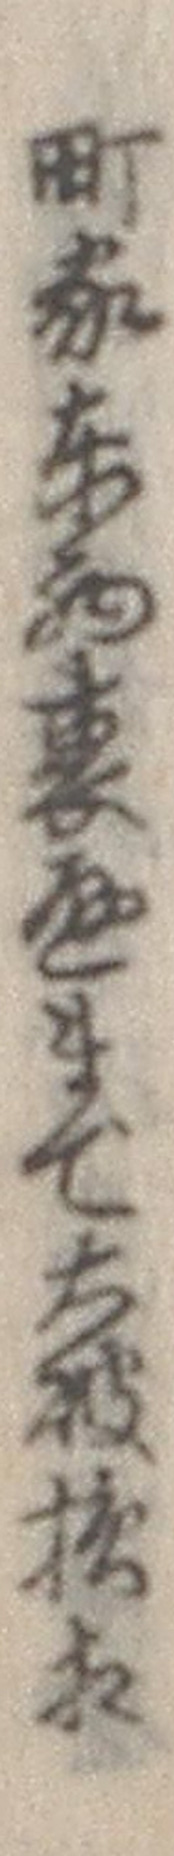町家東西裏遍まで大破損相
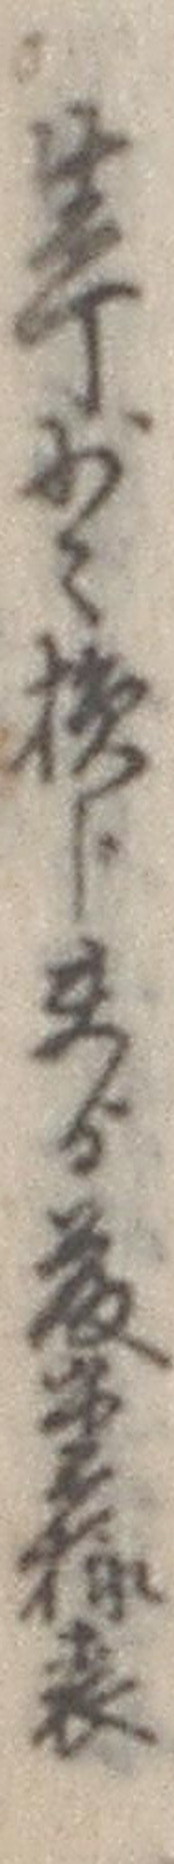生丁少〻損じ夫ゟ藤堂様表
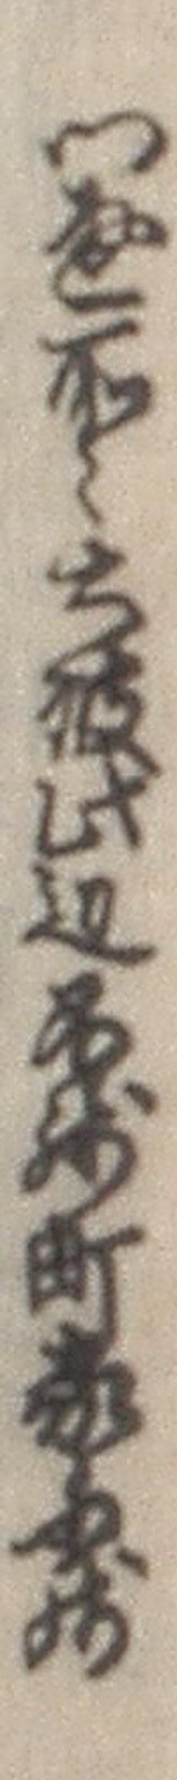門遍所〻大破此辺不残町家不残
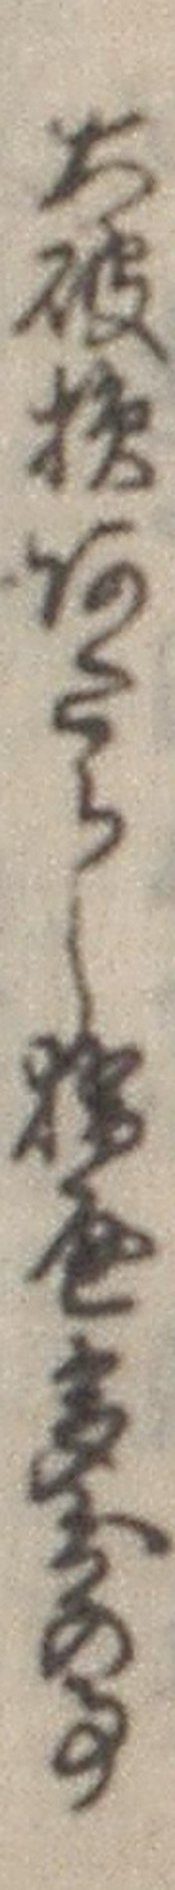大破損あたらし棟多少の事
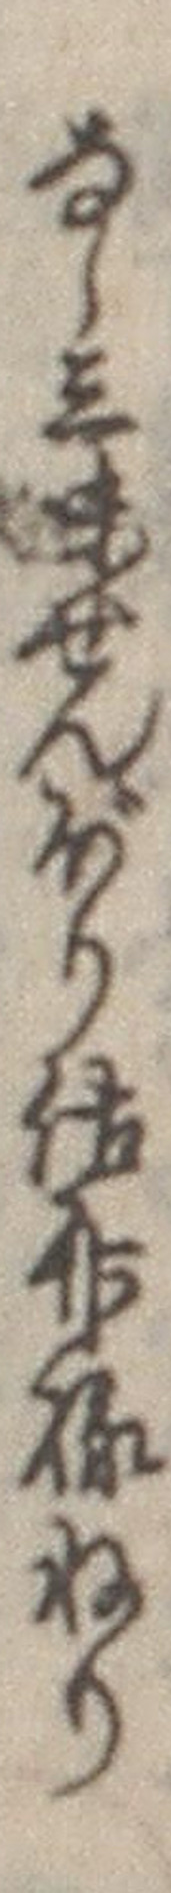なし三味せんぼり佑作様ねり
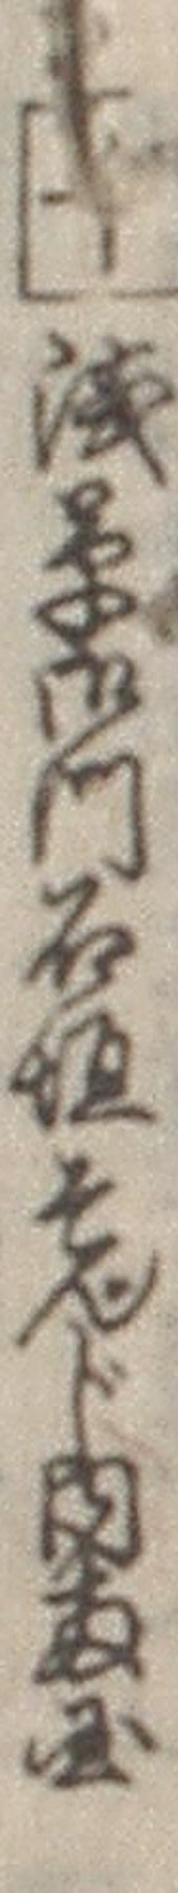十浅草御門石垣そんじ内両国
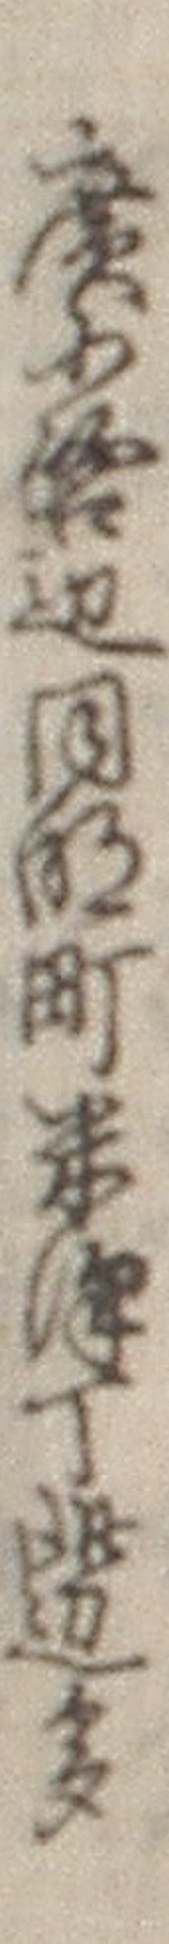廣小路辺同明町米津丁此辺多
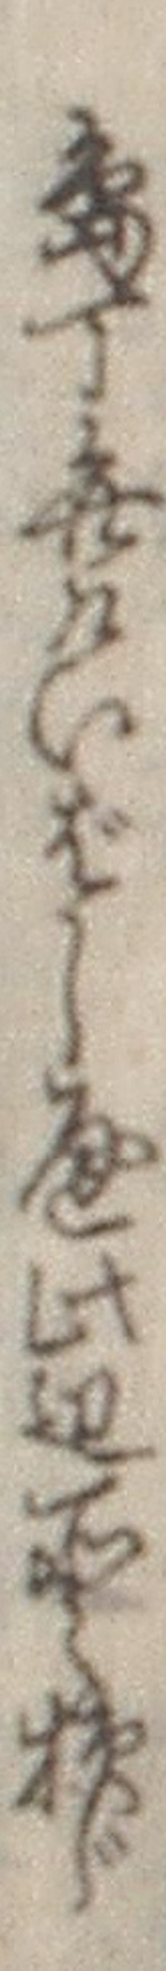島丁弁けいばし通此辺所〻損じ
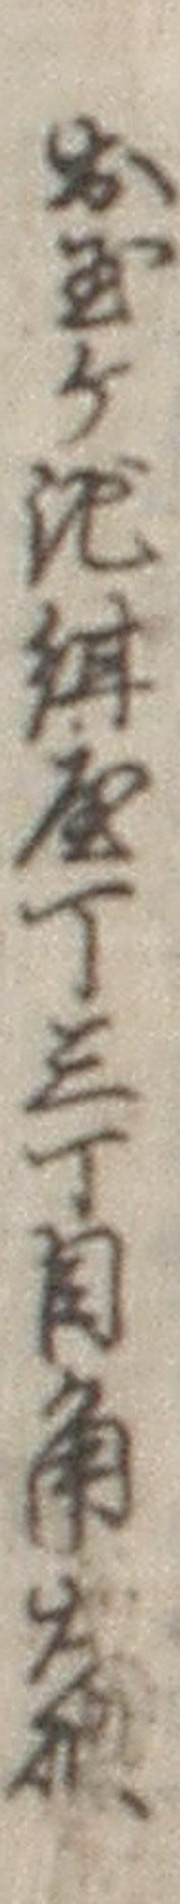お玉ケ池紺屋丁三丁目角大破
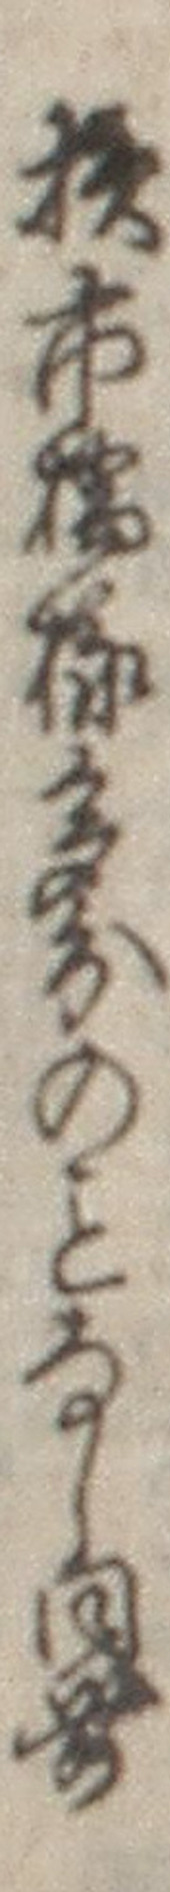損市橋様たぶんのことなし門前
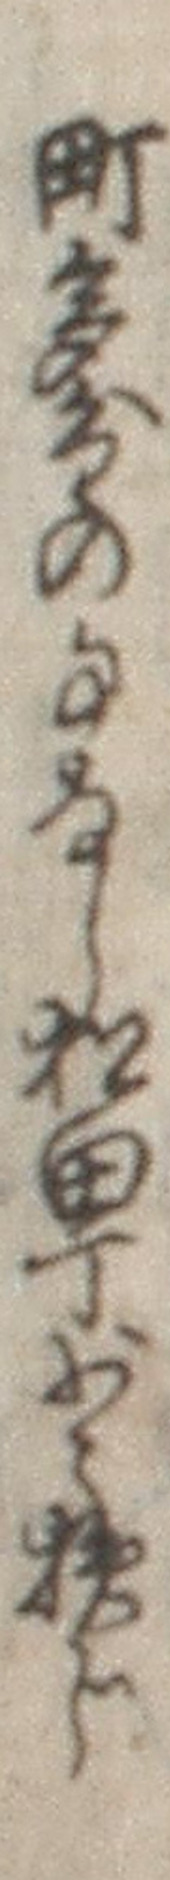町多分の事なし松田丁少〻損じ
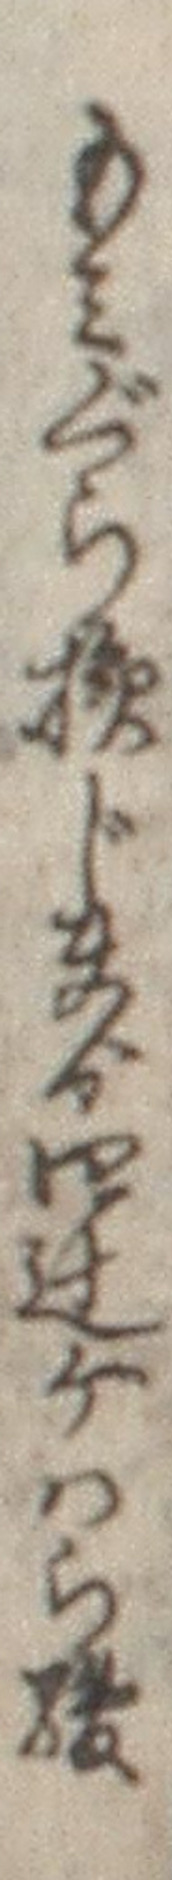もミぐら損じ夫ゟ四辻ケはら駿
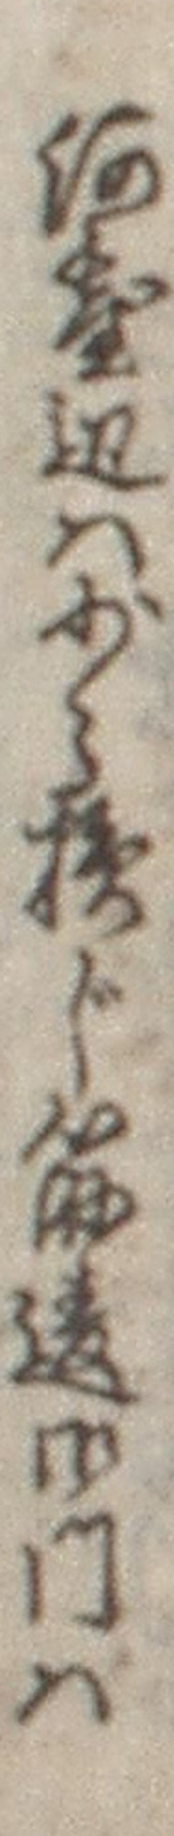河堂辺ハ少〻損じ筋違御門は
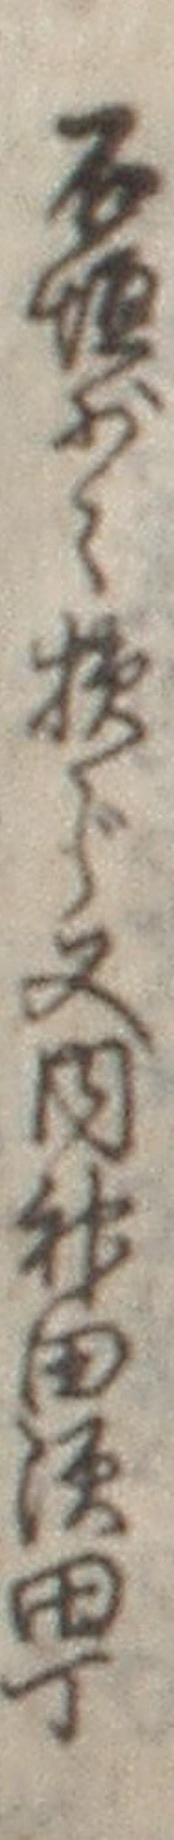石垣少〻損じ又内神田濱田丁
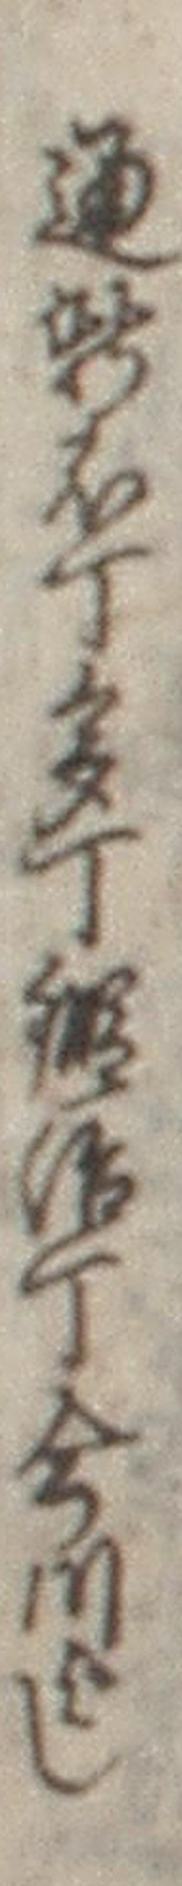通新石丁多丁鍛冶丁今川ばし
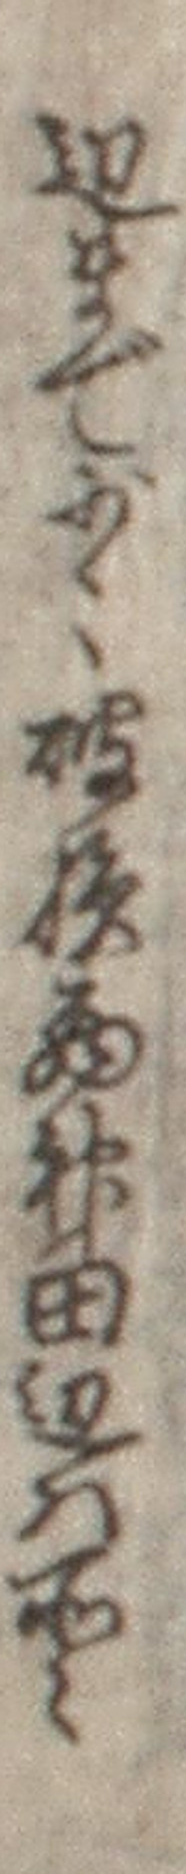辺まで少〻破損西神田辺ハ所〻
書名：江戸　大地震臣細録　全
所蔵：東京大学地震研究所図書室 Earthquake Research Institute Library, The University of Tokyo, JAPAN
